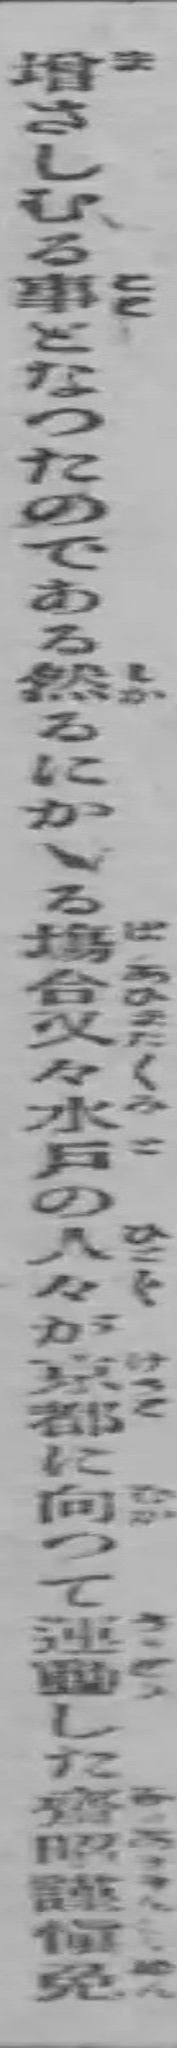増さしむる事となつたのである然るにかゝる場合又々水戸の人々が京都に向つて運動した斉昭謹慎免
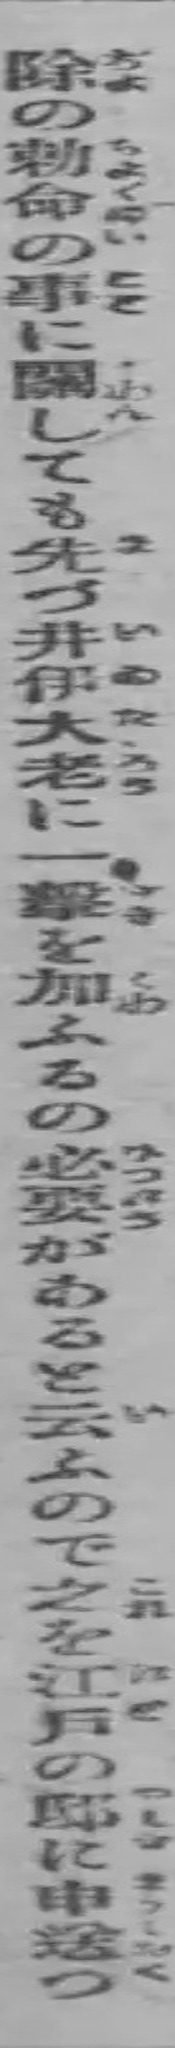除の勅命の事に関しても先づ井伊大老に一撃を加ふるの必要があると云ふので之を江戸の邸に申送つ

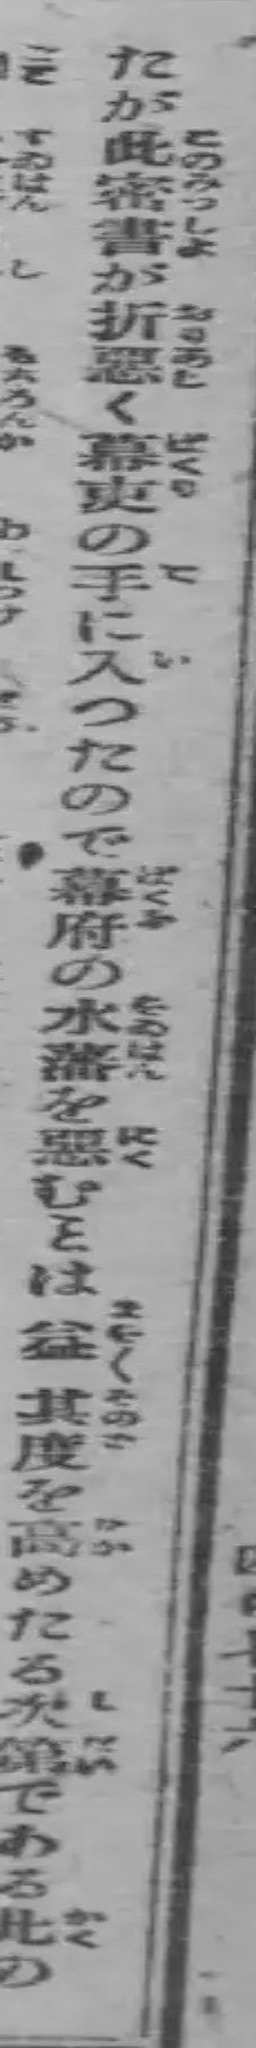たが此密書が折悪く幕吏の手に入つたので幕府の水藩を悪むことは益其度を高めたる次第である此の
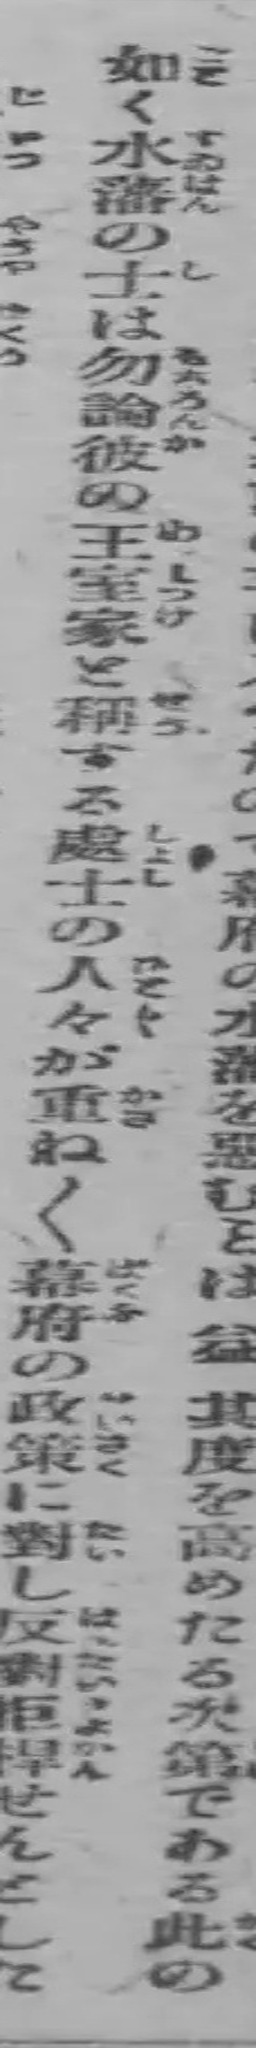如く水藩の士は勿論彼の王室家と称する処士の人々が重ね〳〵幕府の政策に対し反対拒桿せんとした
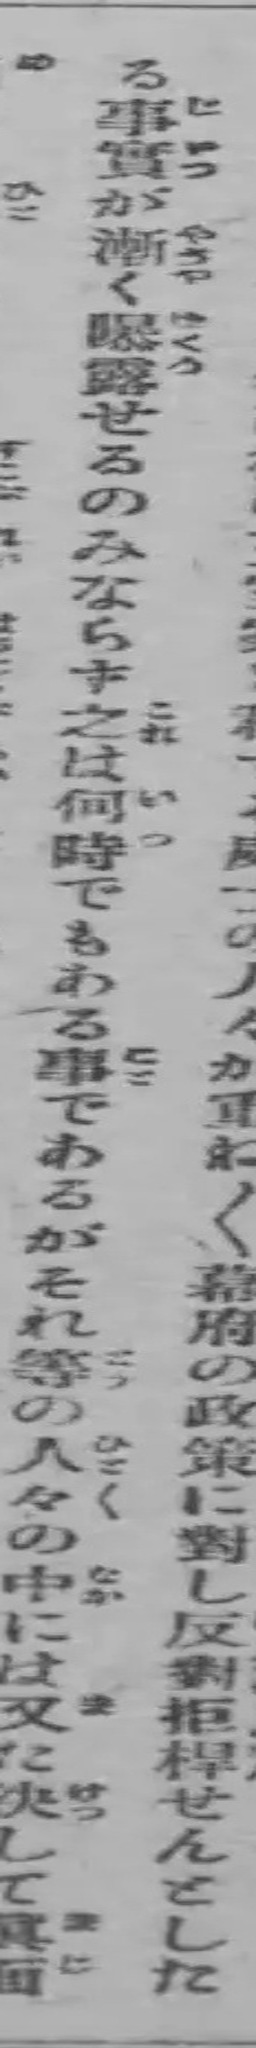る事実が漸く曝露せるのみならず之は何時でもある事であるがそれ等の人々の中には又た決して真面
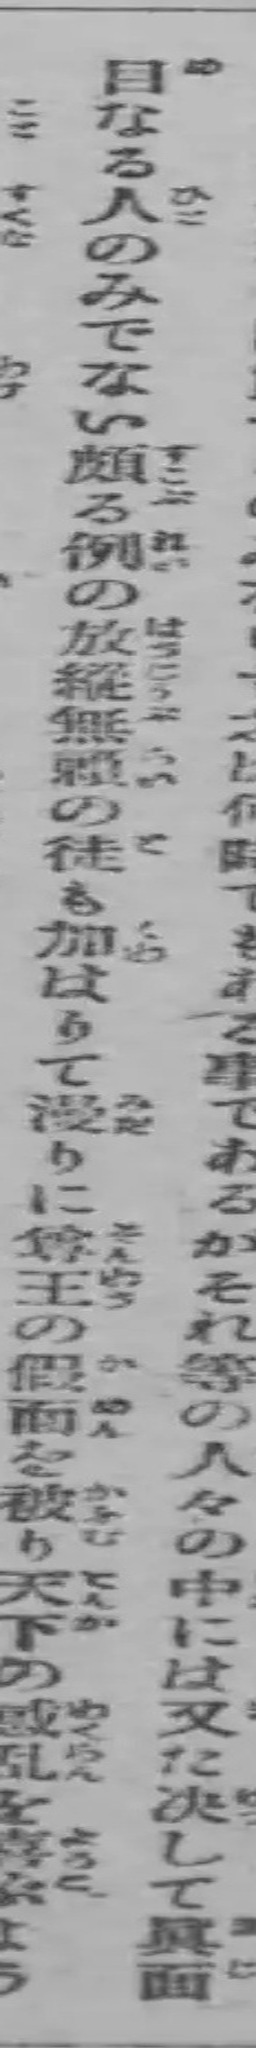目なる人のみでない頗る例の放縦無頼の徒も加はりて漫りに尊王の仮面を被り天下の惑乱を喜ぶよう
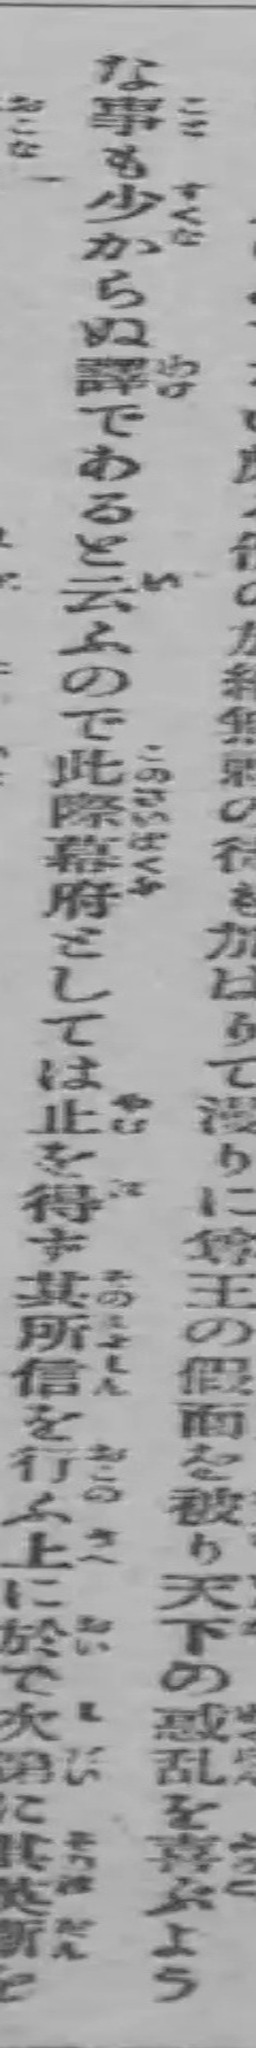な事も少からぬ訳であると云ふので此際幕府としては止を得ず其所信を行ふ上に於て次第に其英断を
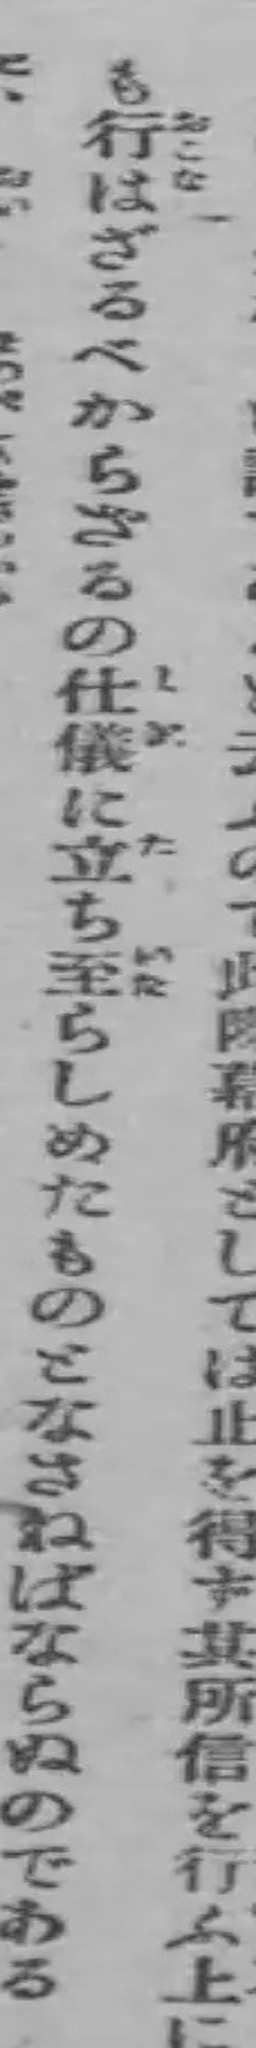も行はざるべからざるの仕儀に立ち至らしめたものとなさねばならぬのである
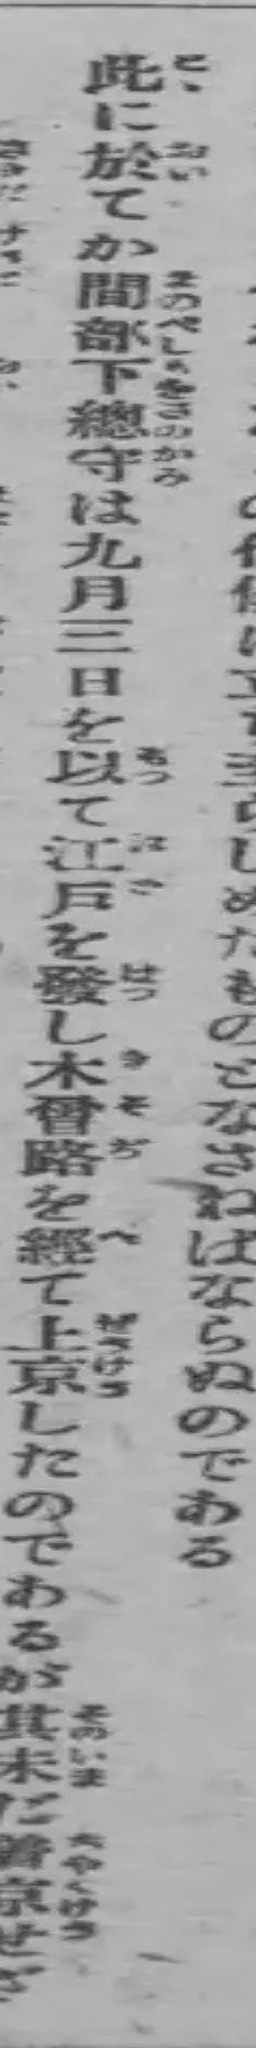此に於てか間部下総守は九月三日を以て江戸を発し木曽路を経て上京したのであるが其未だ着京せざ
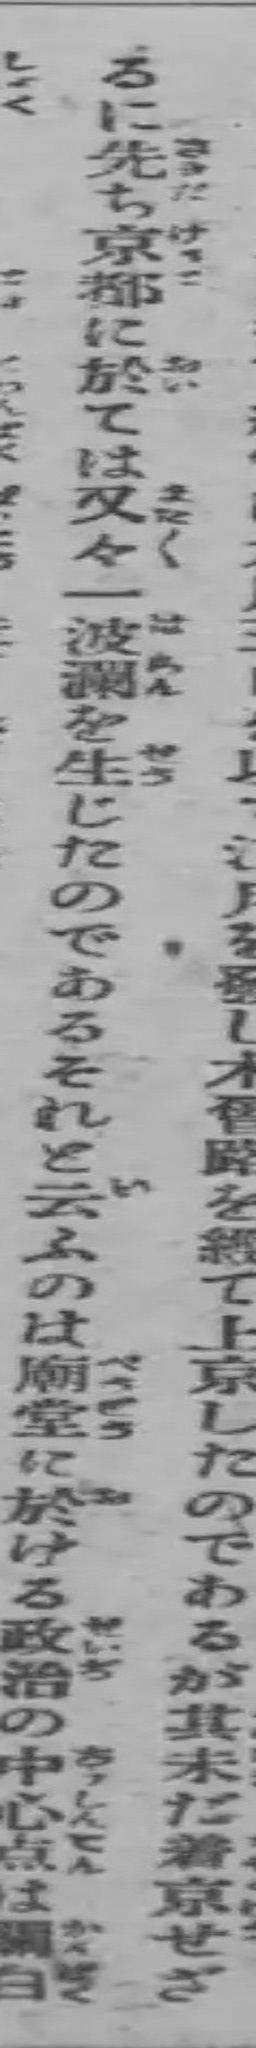るに先ち京都に於ては又々一波瀾を生じたのであるそれと云ふのは廟堂に於ける政治の中心点は関白
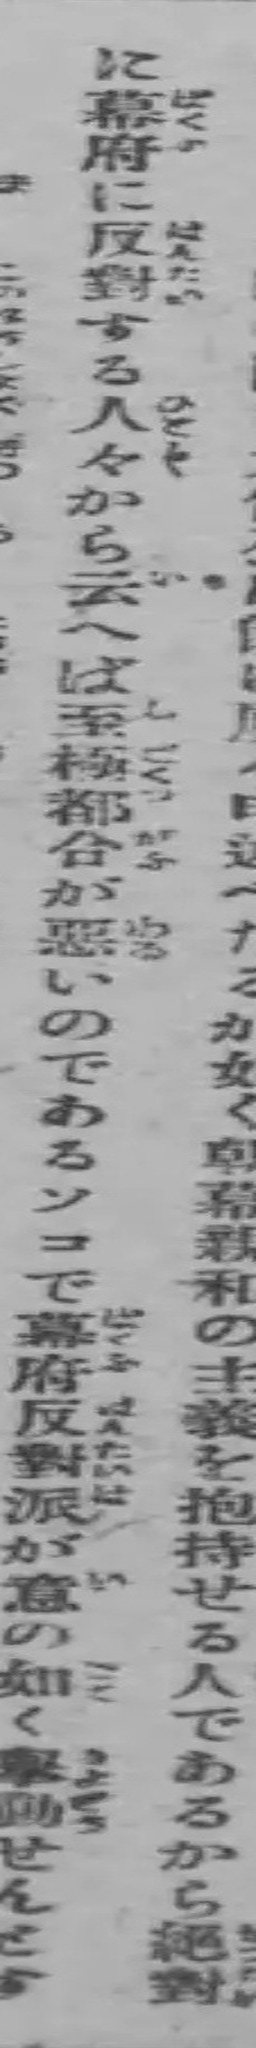に幕府に反対する人々から云へば至極都合が悪いのであるソコで幕府反対派が意のごとく挙動せんとす
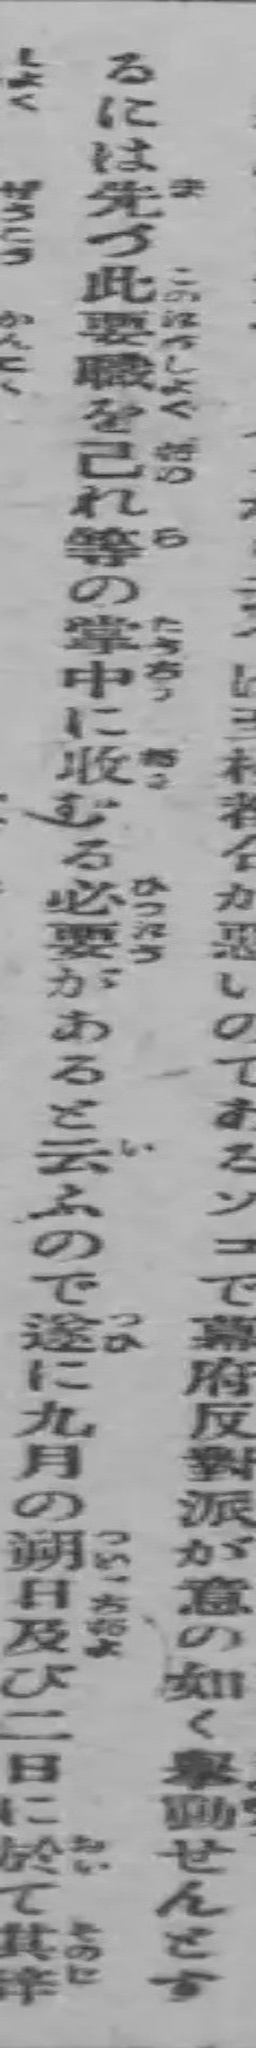るには先づ此要職を己れ等の掌中に収むる必要があると云ふので遂に九月の朔日及び二日に於て其辞
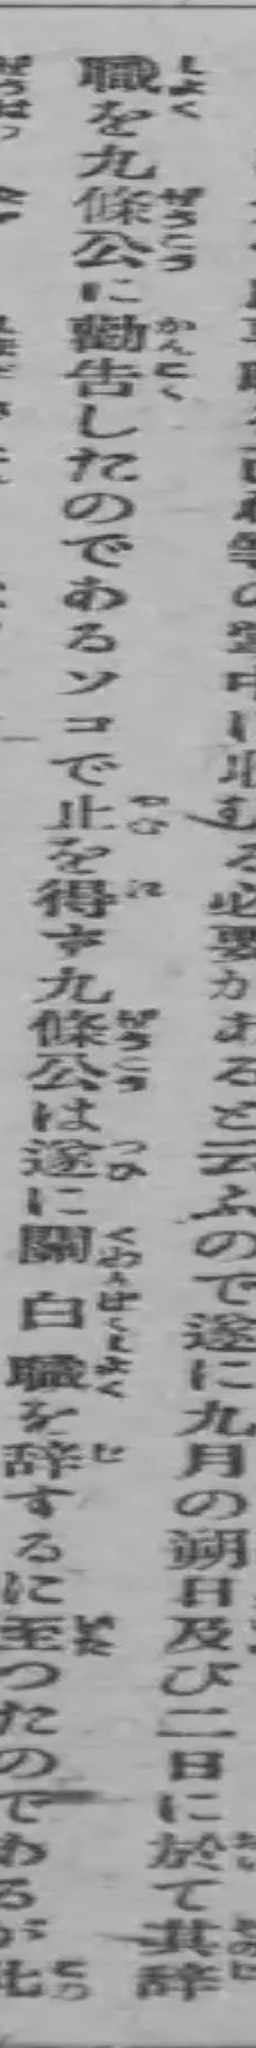職を九条公に勧告したのであるソコで止を得ず九条公は遂に関白職を辞するに至つたのであるが此
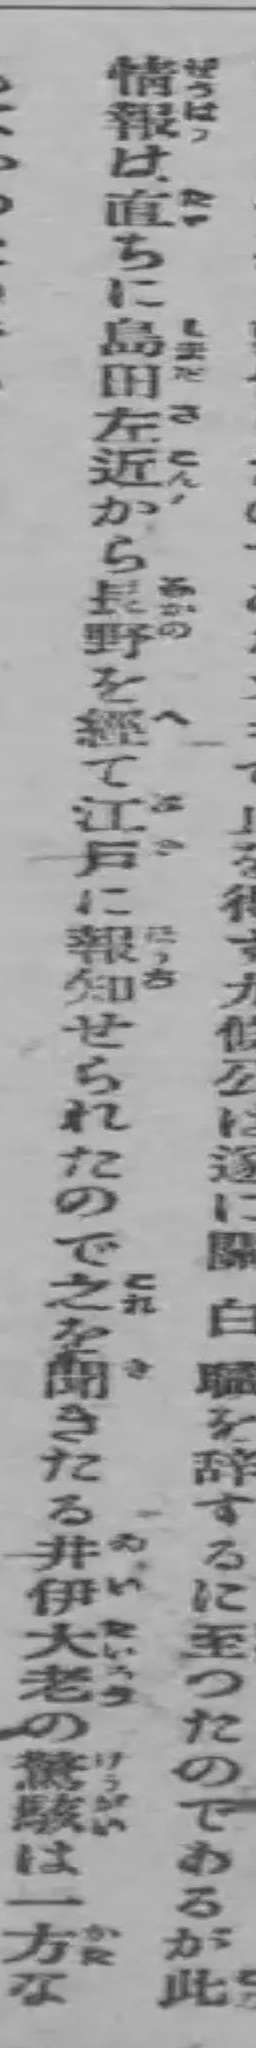情報は直ちに島田左近から長野を経て江戸に報知せられたので之を聞きたる井伊大老の驚駭は一方な
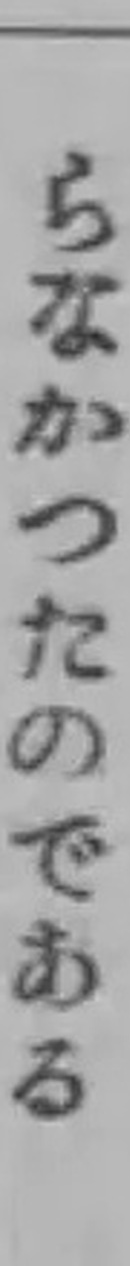らなかつたのである
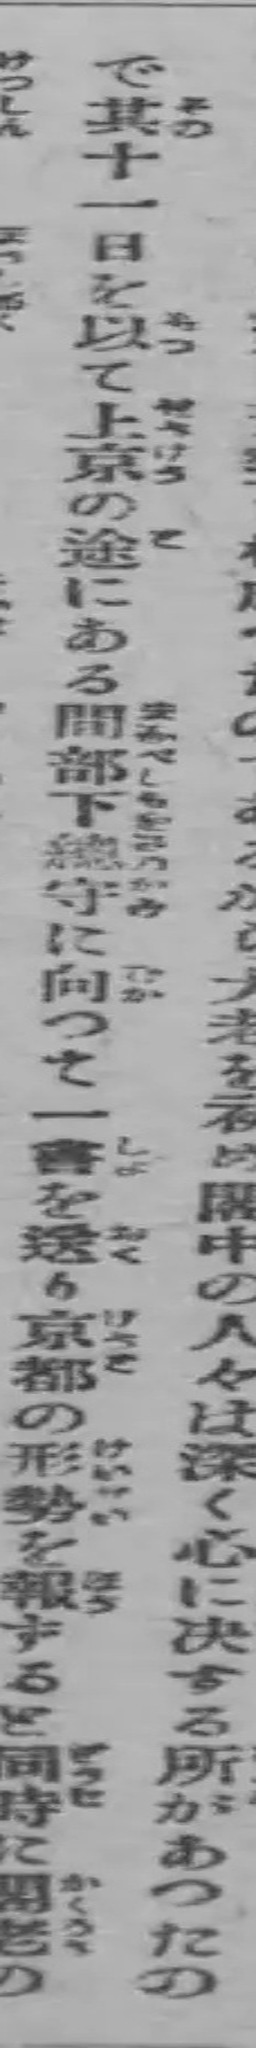で其十一日を以て上京の途にある間部下総守に向つて一書を送り京都の形勢を報ずると同時に閣老の
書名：豊橋市史談
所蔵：国立国会図書館 National Diet Library, JAPAN
